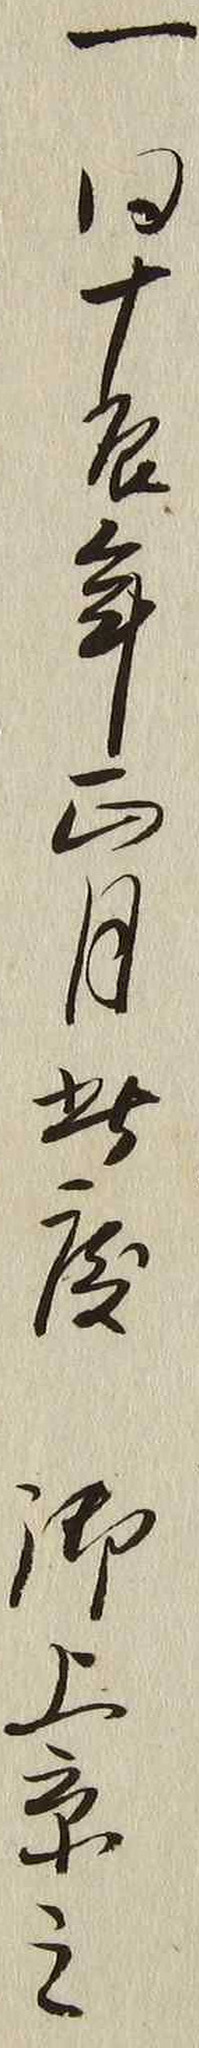一同十辰年正月此度御上京之
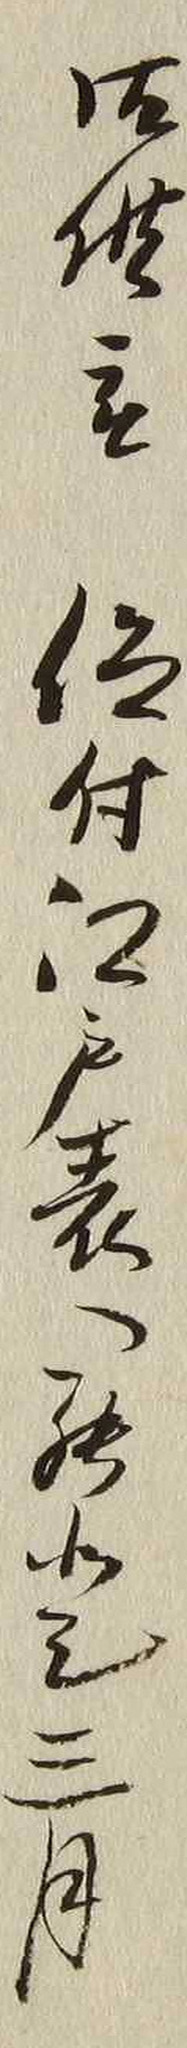御供被仰付江戸表へ罷登三月
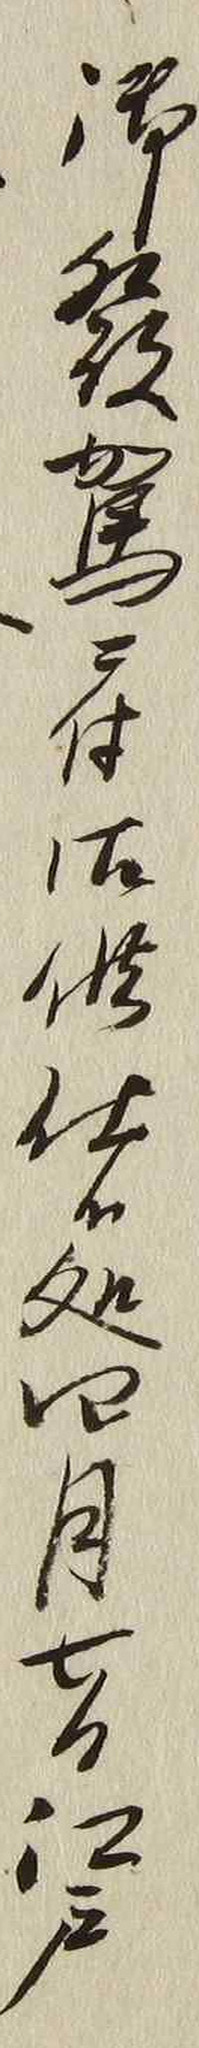御発駕ニ付御供仕候処四月七日江戸
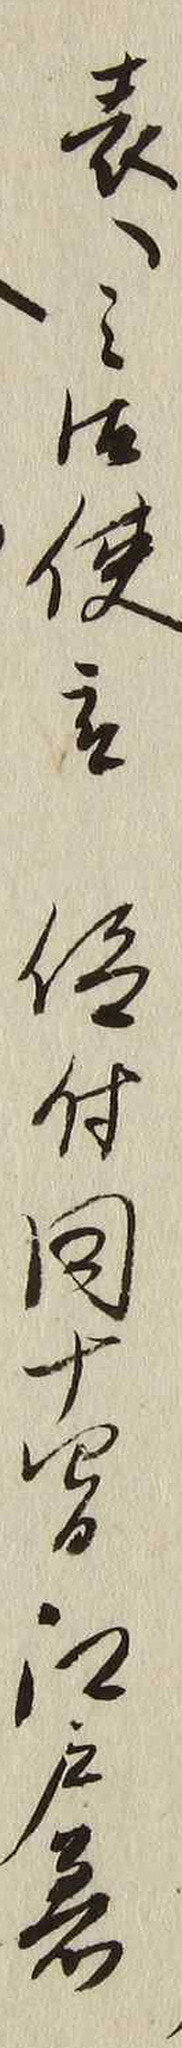表へ之御使被仰付同十四日江戸着
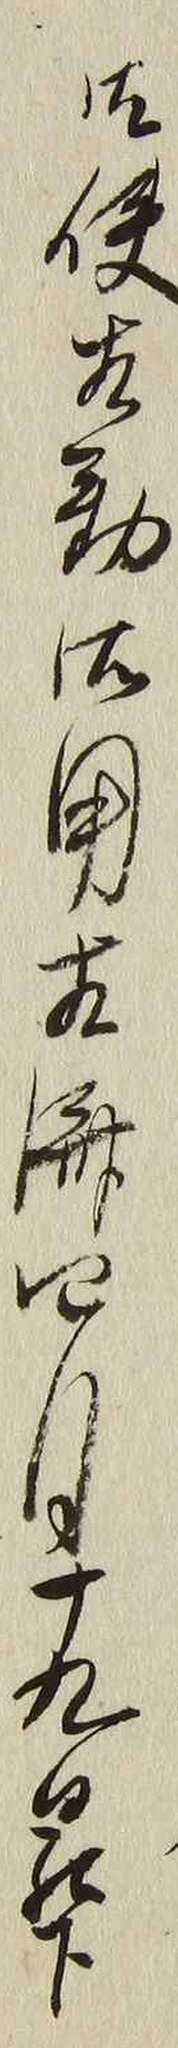御使相勤御用相済四月十九日罷下
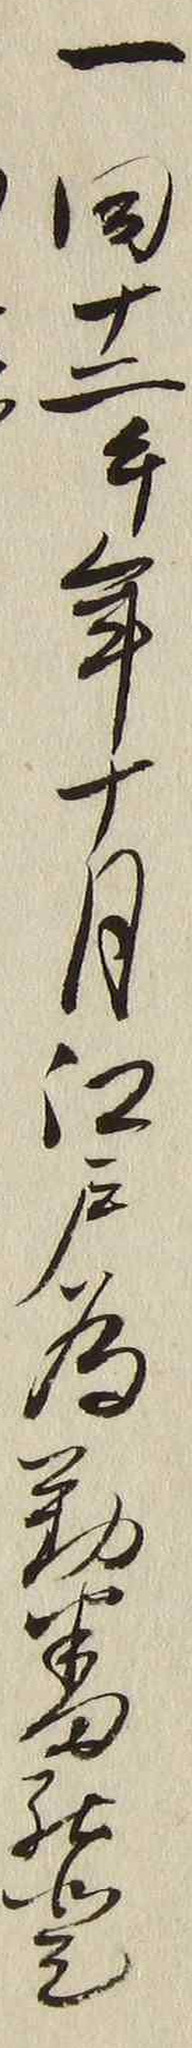一同十二午年十月江戸為勤番罷登
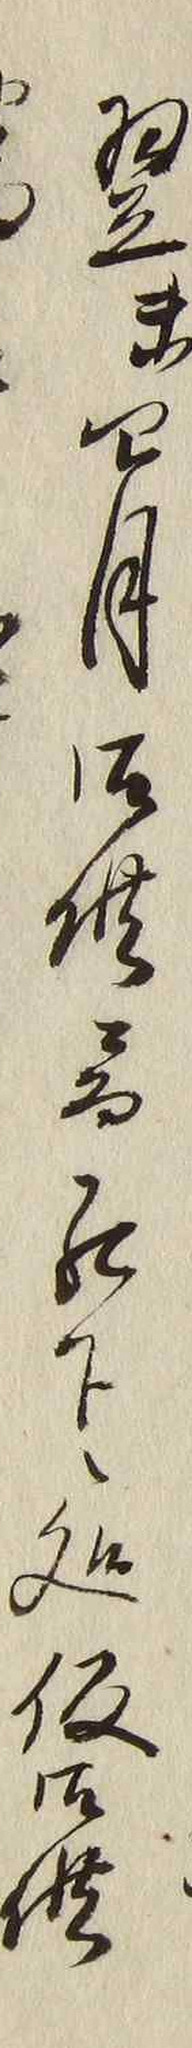翌未四月御供ニ而罷下候処仮御供
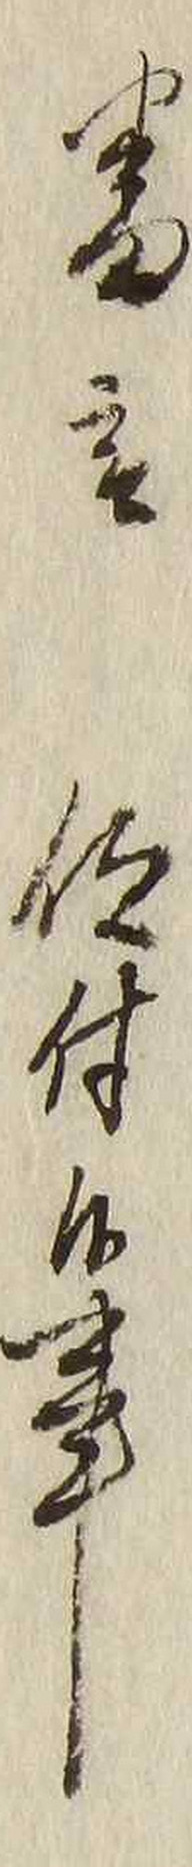番被仰付候事

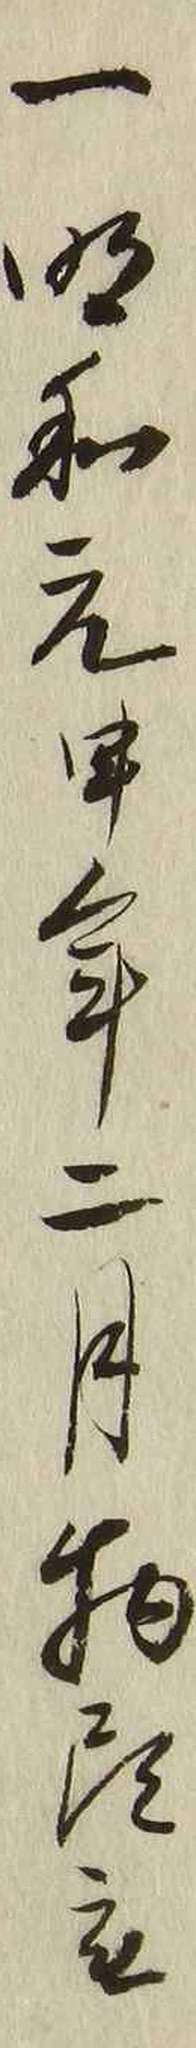一明和元申年二月物頭被
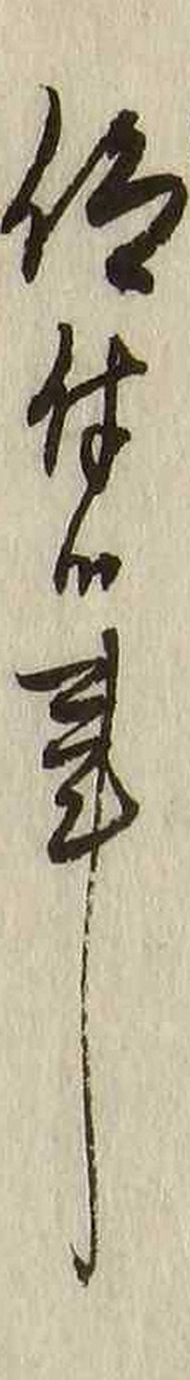仰付候事
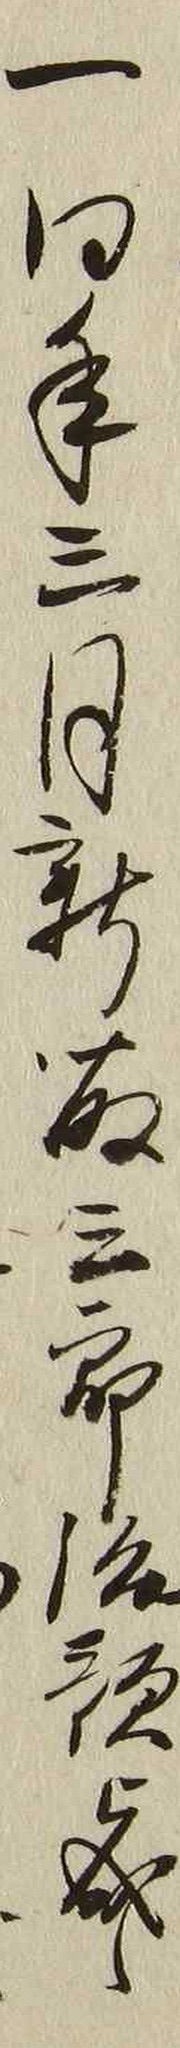一同年三月新藤三郎御預被成候
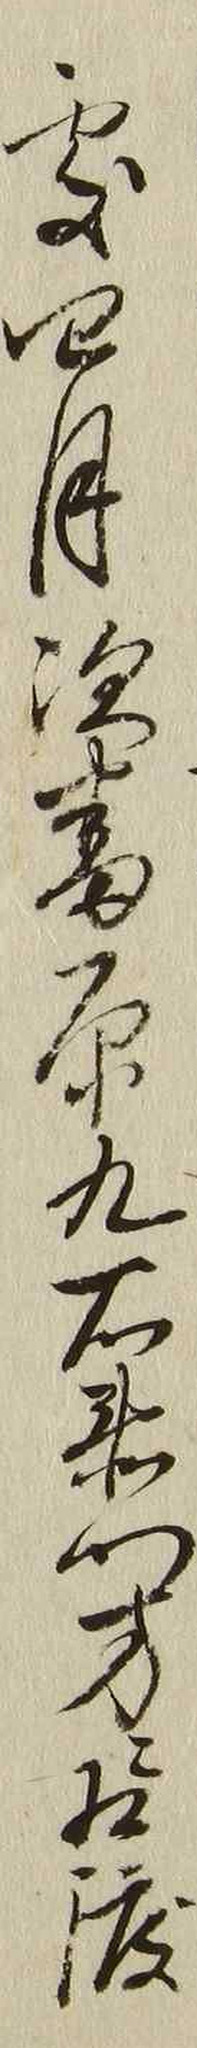処四月次番原九右衛門方ニ相渡
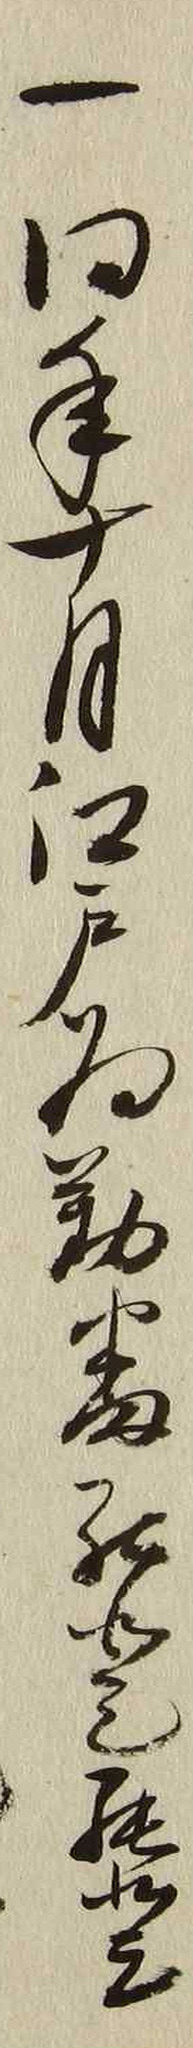一同年十月江戸為勤番罷登罷登
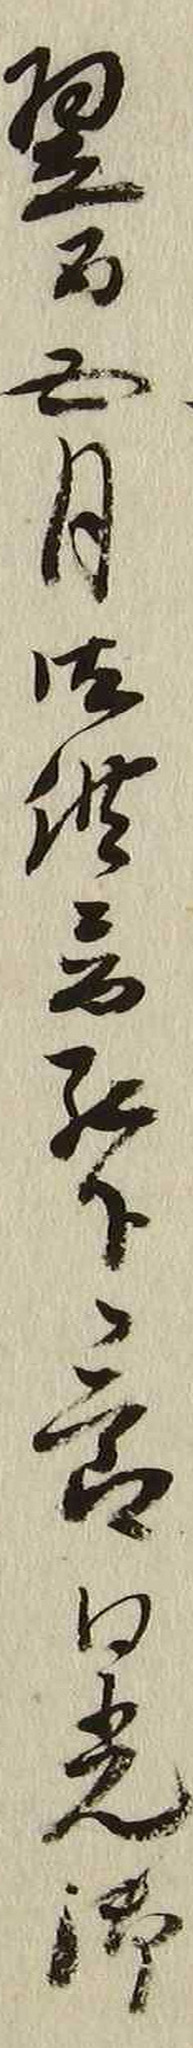翌酉五月御供ニ而罷下候節日光御
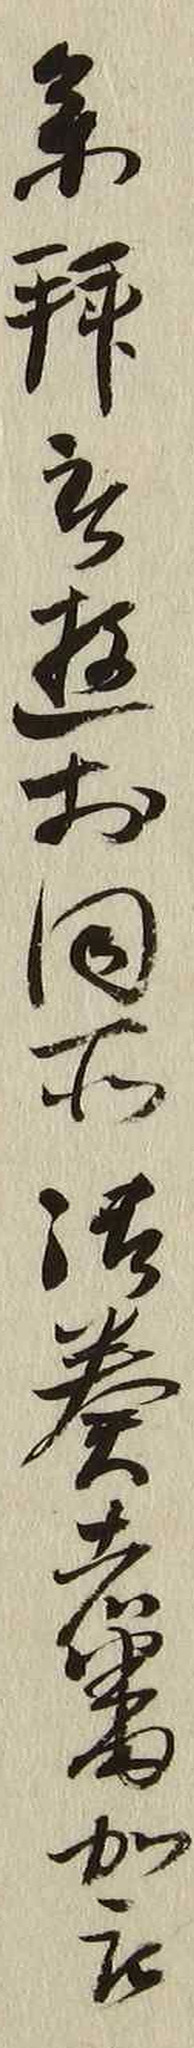参拝被遊於同所御奏者番加被
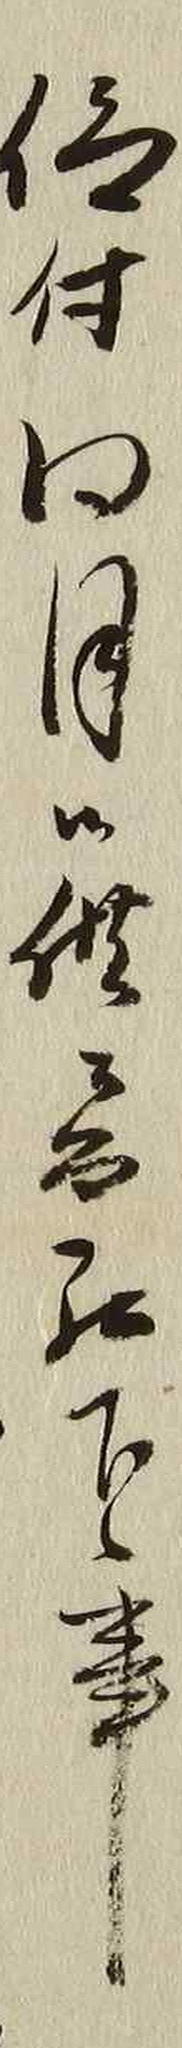仰付同月御供ニ而罷下候事
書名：諸士系譜　巻之348　も之部4
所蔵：会津若松市立会津図書館
